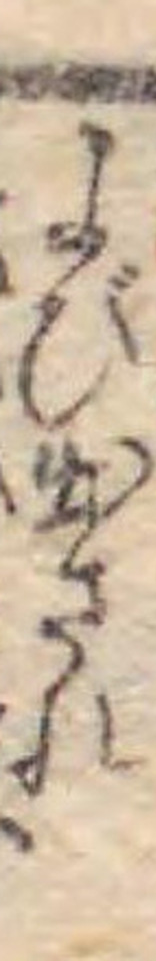よび出され
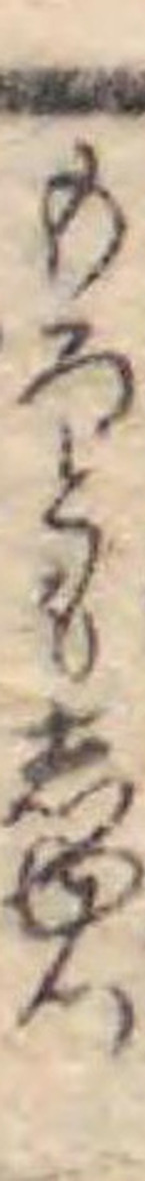もろともしゆつ
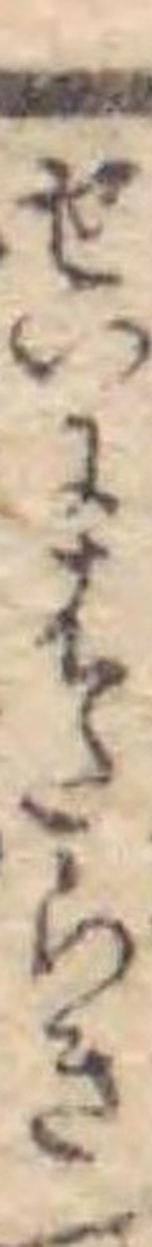せいにはたらき
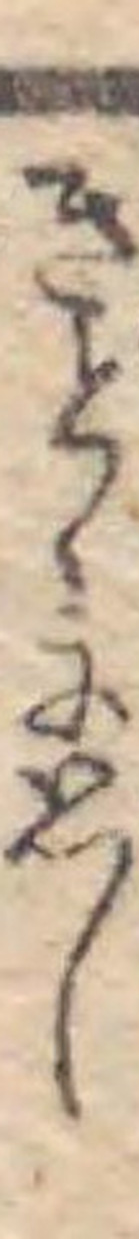きとくに思し
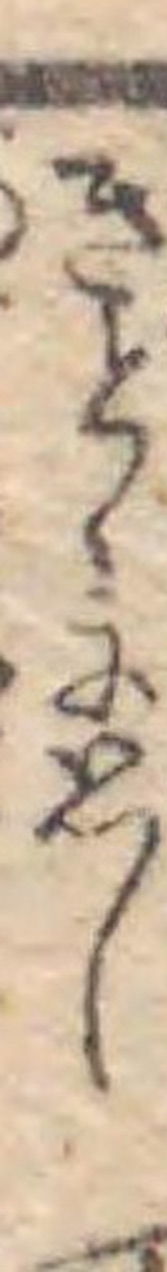きとくに思し
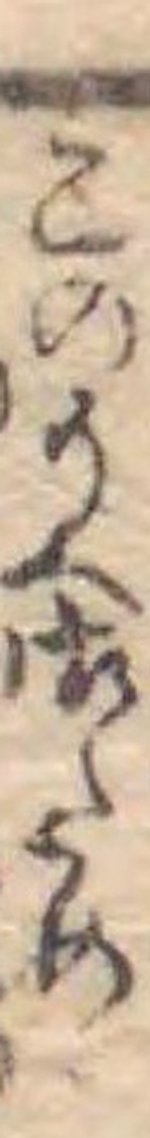このうへ御ため
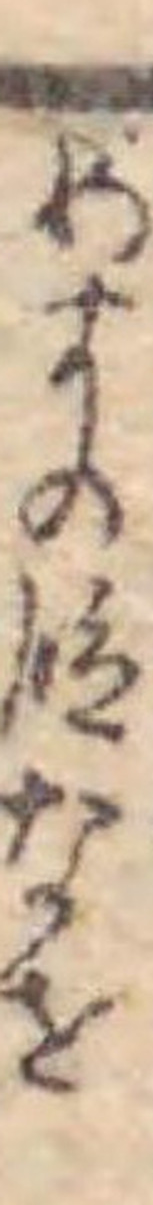めすの段なを
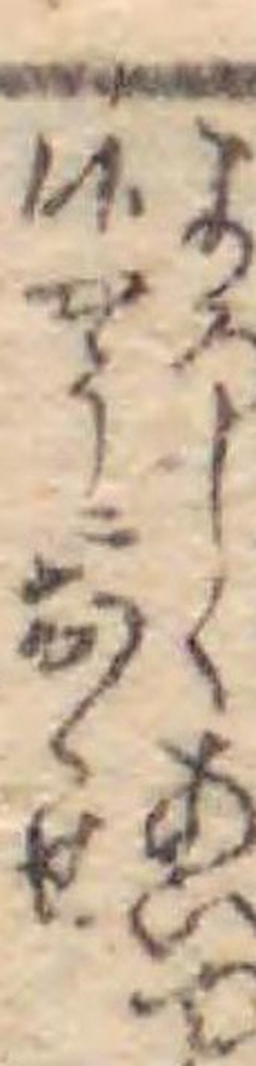御やうにおゝせ
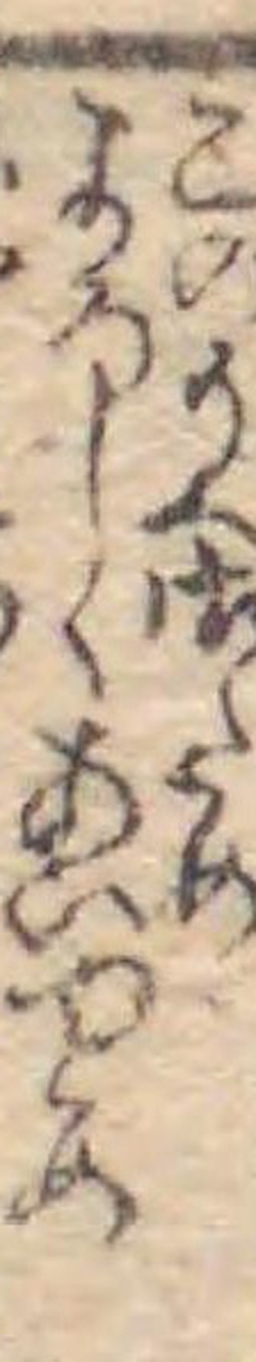よろしくあいつとめ
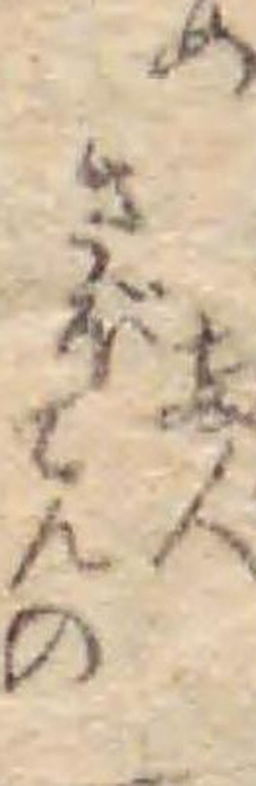さぼてんの
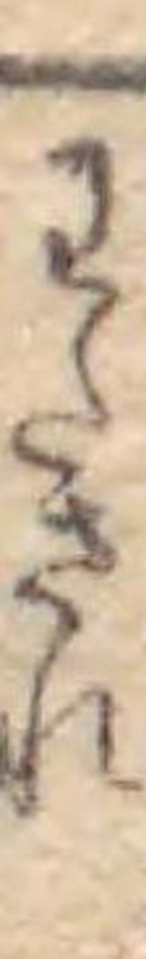わたされ
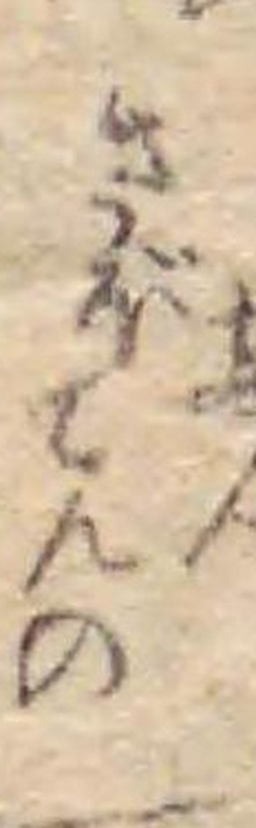さぼてんの
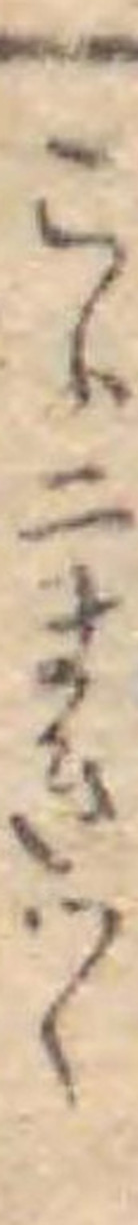こふ二まきつゝ
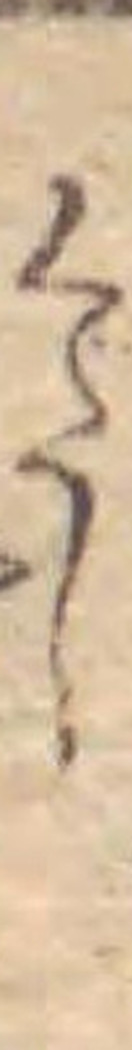くだし
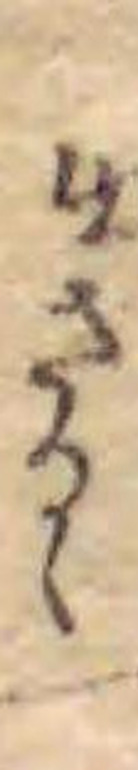出さるゝ
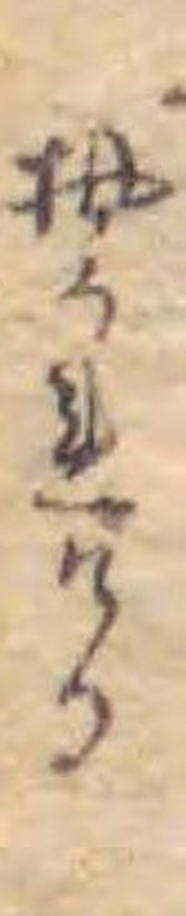おかれける
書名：悦贔負蝦夷押領 : 3巻
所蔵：国立国会図書館 National Diet Library, JAPAN
